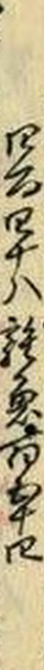四百四十八雑魚百五十四
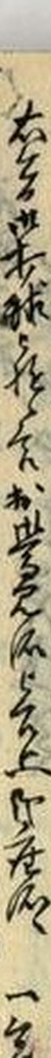右今日御打毬被遊候節於御馬見所被召上御座所へ
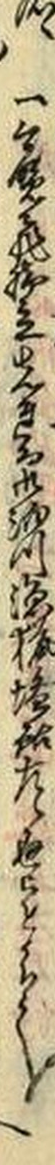一今晩飛脚立先達而御越川漁猟塩鮎左之通被進之
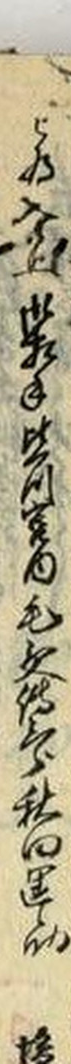被為入上御相手皆川宮内毛受伝三郎秋田道之助
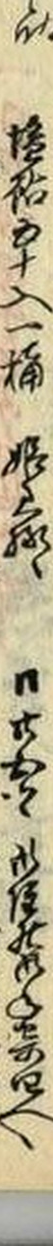拾鮎五十入一桶姫君様へ同廿五ツヽ御住居御年寄四人
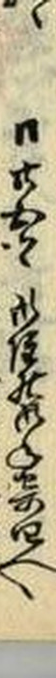同廿ツヽ御手前御年寄三人
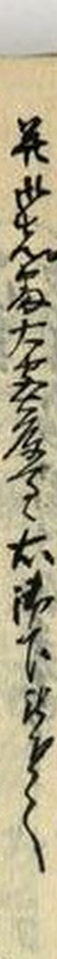并御先番大宮藤馬候右御下被進之
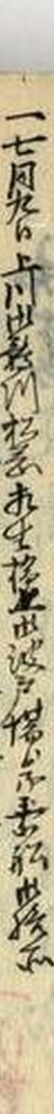一七月九日上川御鵜川松岡相生橋上御波戸場ゟ御乗船御膳所
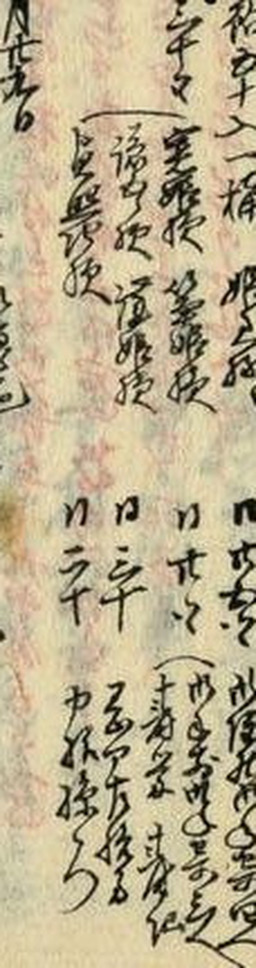謙五郎様謹姫様同三十岡部左膳方
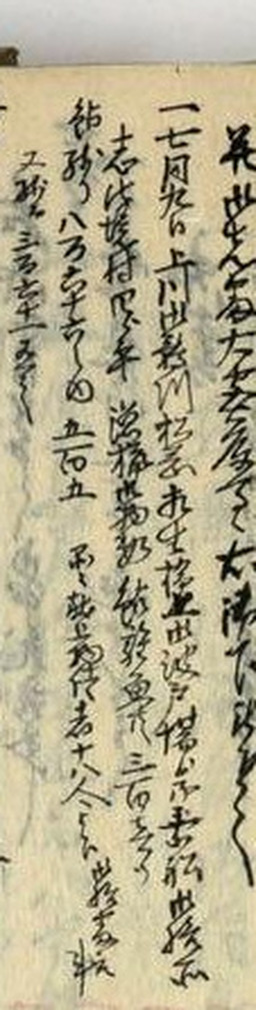志比境村四郎平漁猟御物数鮎雑魚共三百壱ツ
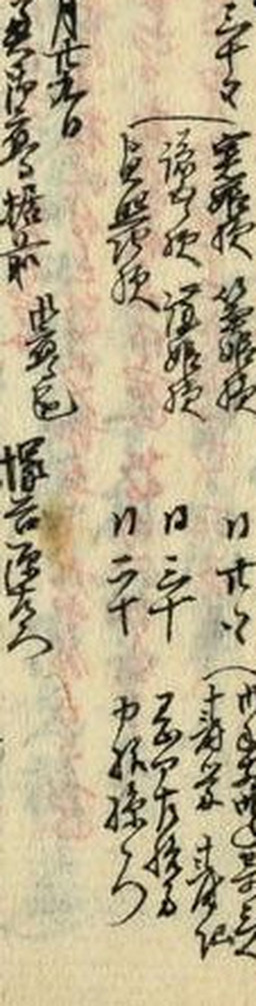貞照院様同二十中根孫右衛門
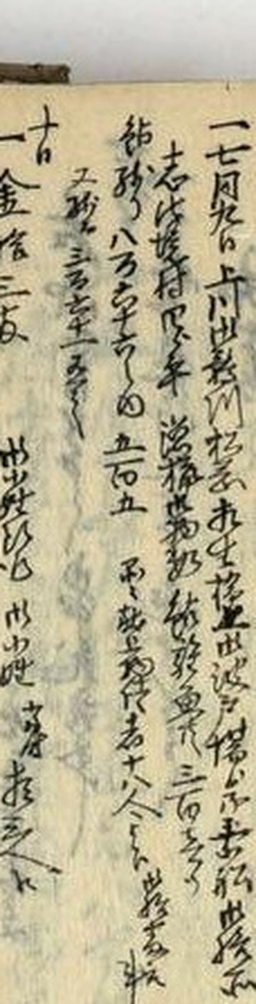鮎残り八百六十六之内五百五品々献上仕候者十八人へ被下御膳番取斗
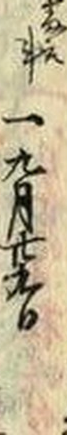一九月廿九日
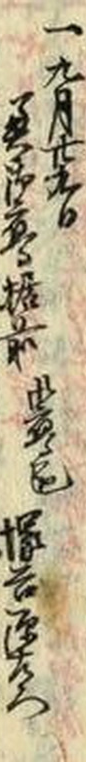奥御鷹据前御鷹匠塚谷源左衛門
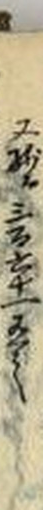又残而三百六十一有之
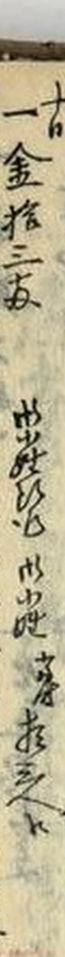金拾三両御小姓頭取御小姓当時拾三人江
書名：少傅日録抄（斉承付側向頭取日記、在国）
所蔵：福井県文書館 Fukui Prefectural Archives
